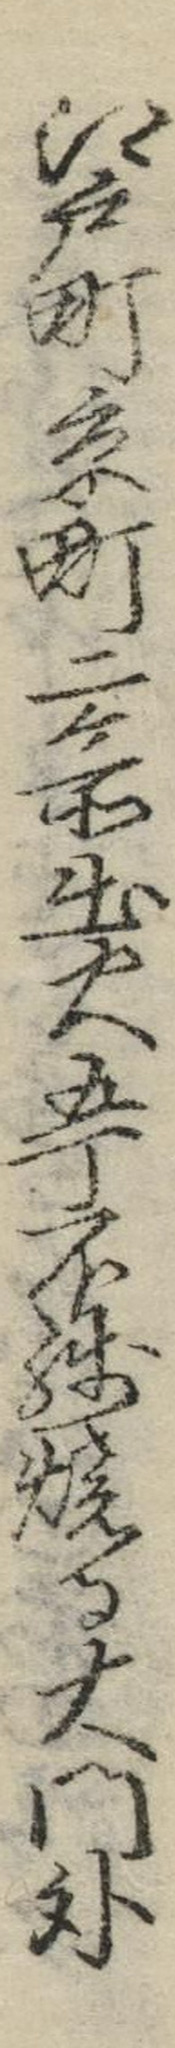江戸町京町二ケ所出火五丁不残焼る大門外
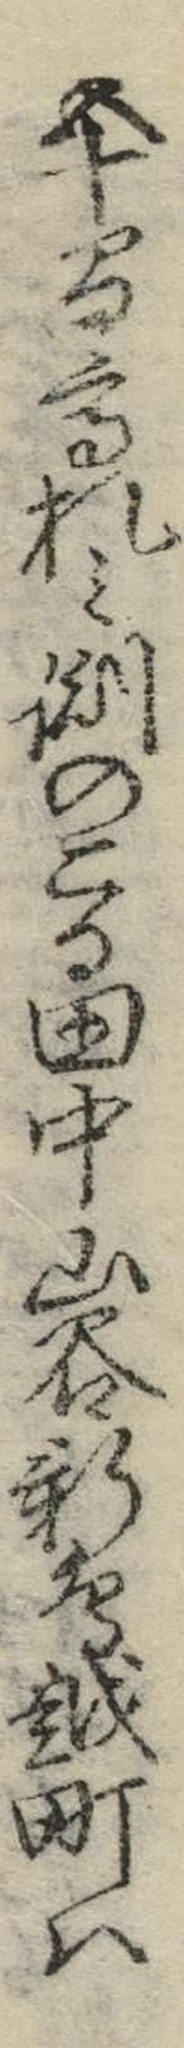五十間高札之倒のこる田中山谷新鳥越町ハ
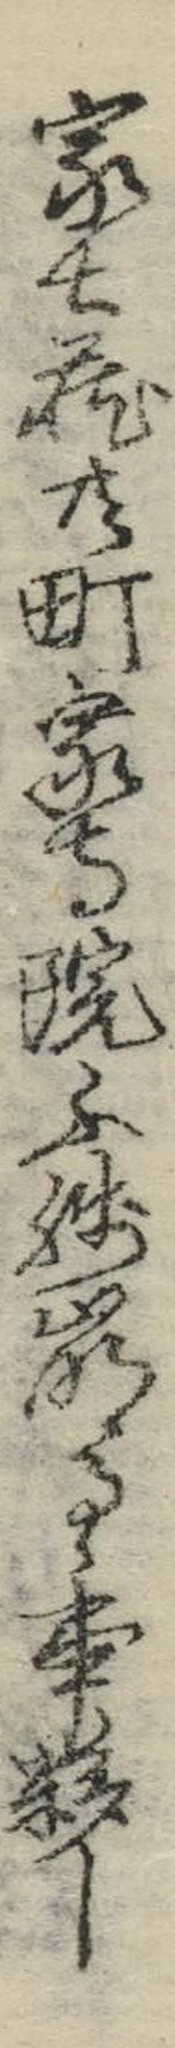家土蔵共町家寺院不残崩る事夥し
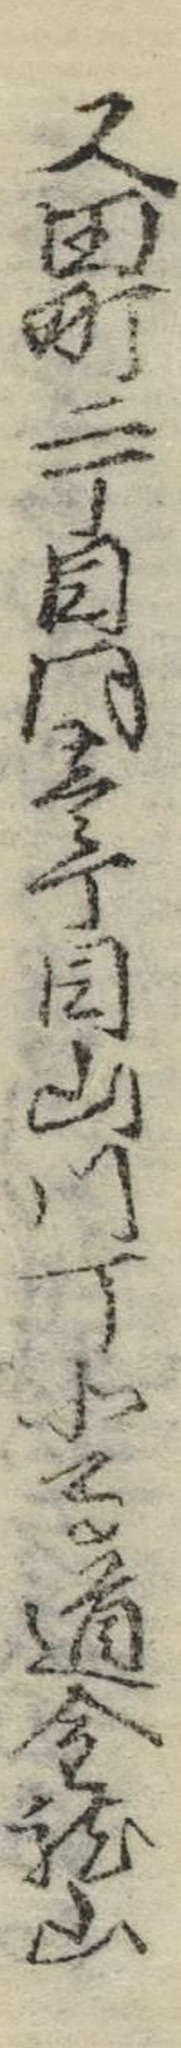久田町二丁目同壱丁目山川丁北馬道金龍山
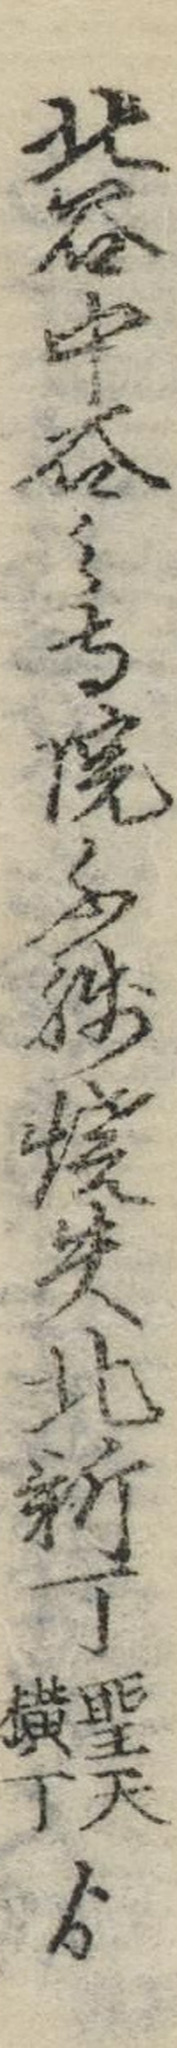北谷中谷之寺院不残焼失北新丁聖天横丁ゟ
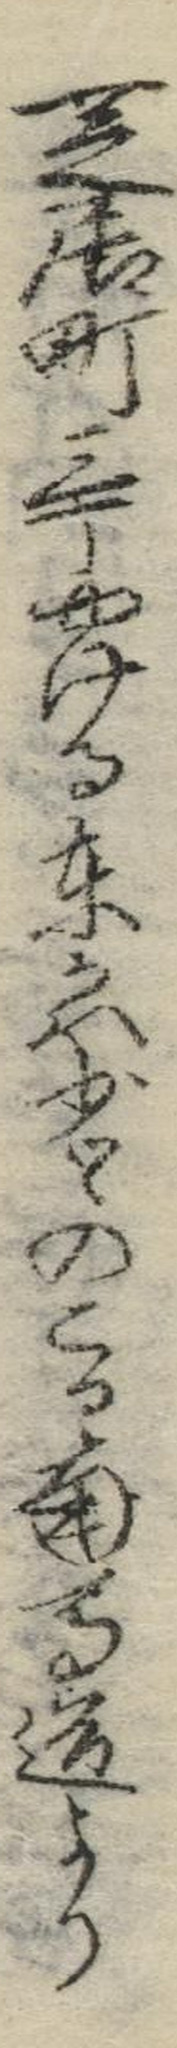芝居町三丁やける東かハ少ツヽのこる南馬道より

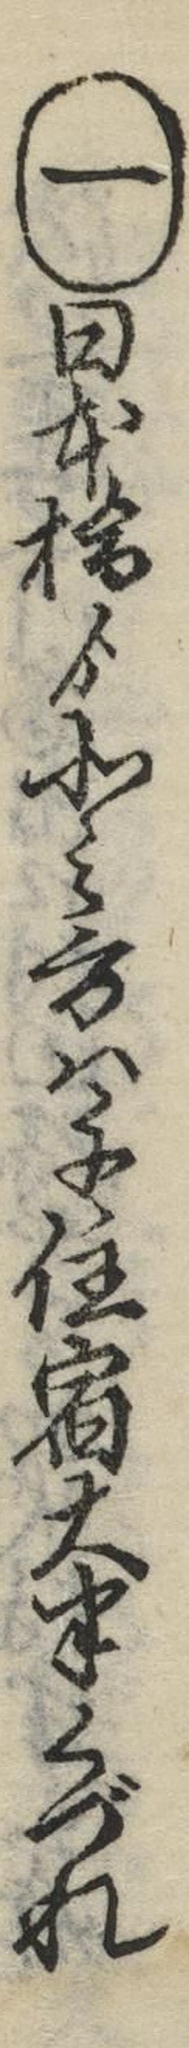一日本橋ゟ北之方ハ千住宿大半くづれ
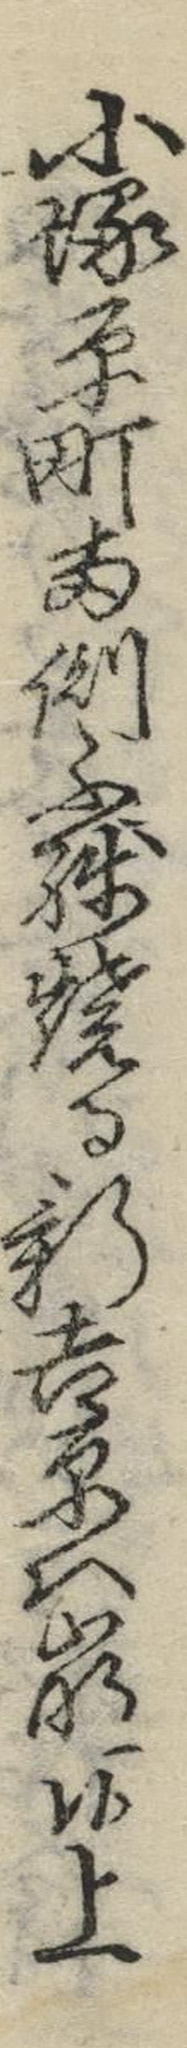小塚原町両側不残焼る新吉原ハ崩候上
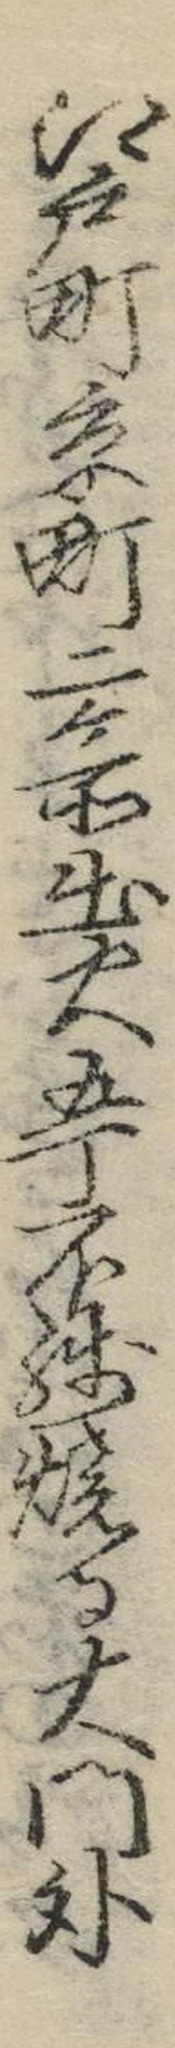江戸町京町二ケ所出火五丁不残焼る大門外
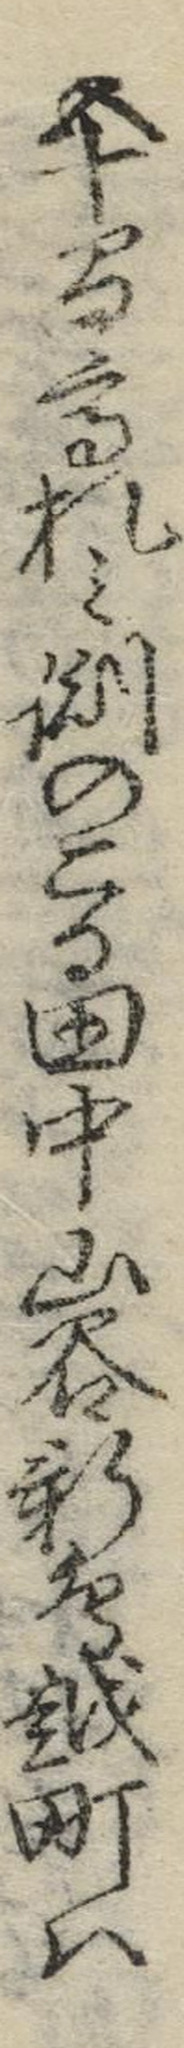五十間高札之倒のこる田中山谷新鳥越町ハ
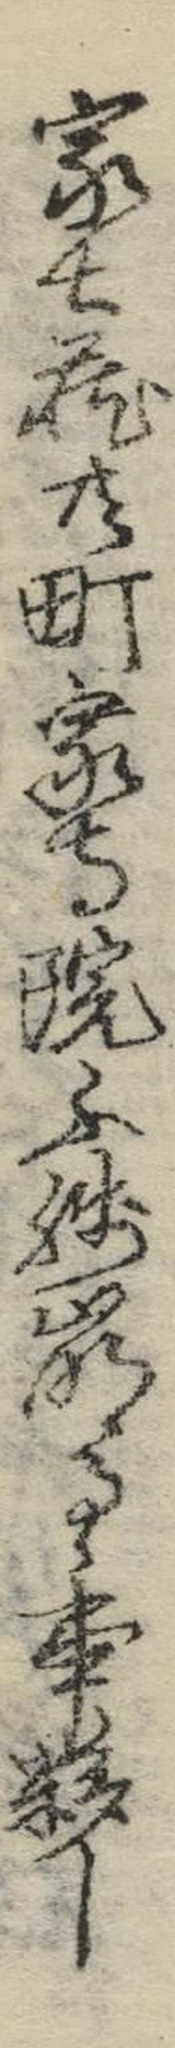家土蔵共町家寺院不残崩るゝ事夥し
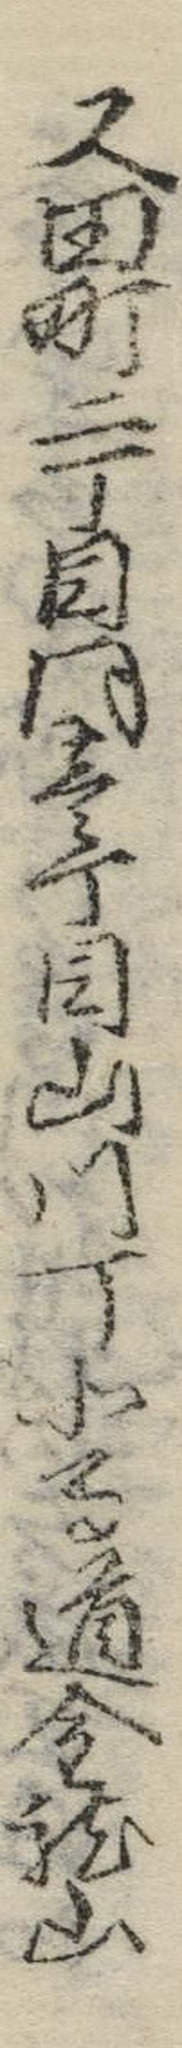久田町二丁目同壱丁目山川丁北馬道金龍山
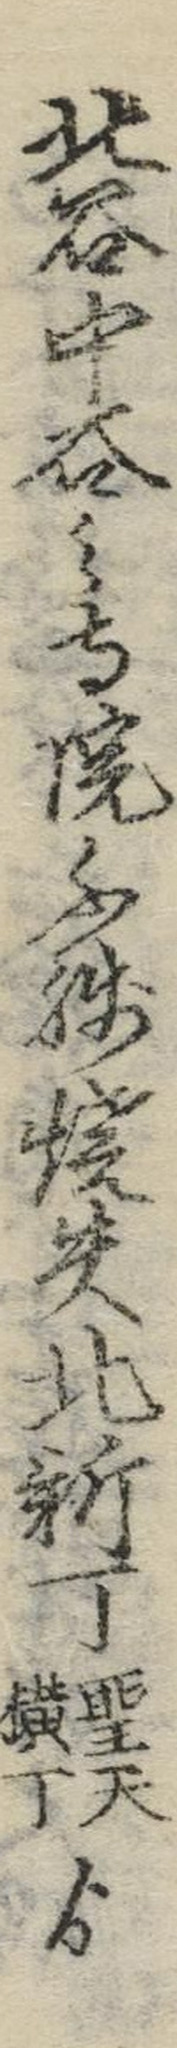北谷中谷之寺院不残焼失北新丁聖天横丁ゟ
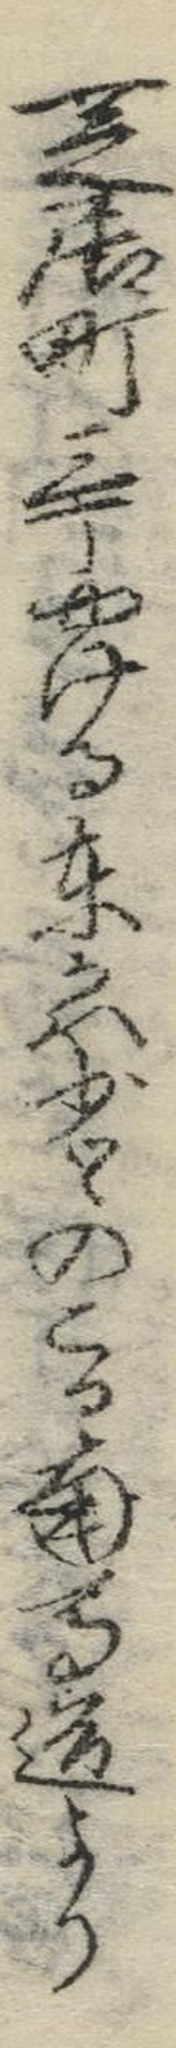芝居町三丁やける東かハ少ツヽのこる南馬道より
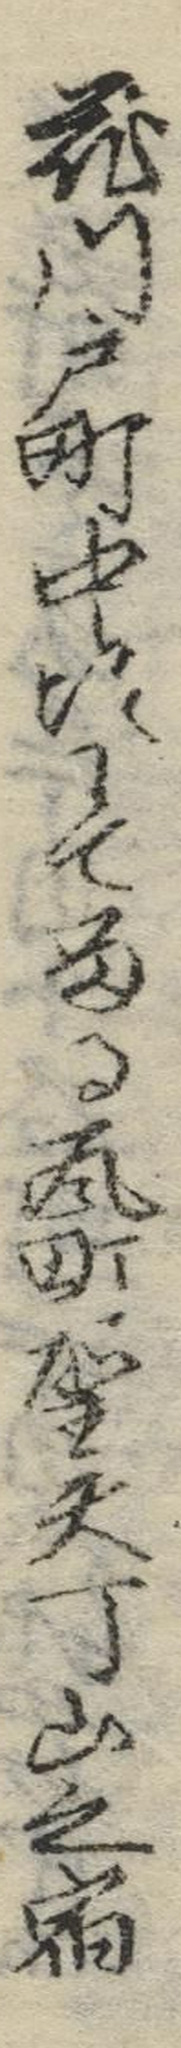花川戸町中頃にて留る瓦町聖天丁山之宿
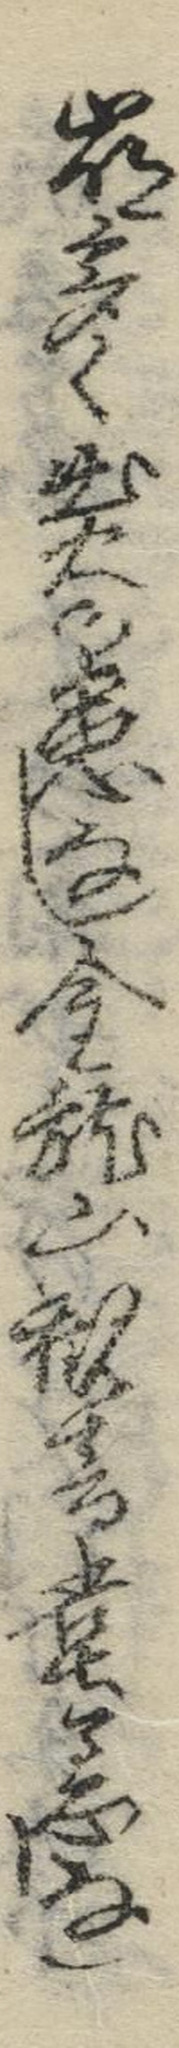崩多く出火の患なし金龍山観音堂恙なし
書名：江戸御屋鋪方町方共　地震類焼場所巨細書之寫　潰家潰土蔵共取調附街道筋近在迄
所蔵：東京大学地震研究所図書室 Earthquake Research Institute Library, The University of Tokyo, JAPAN
